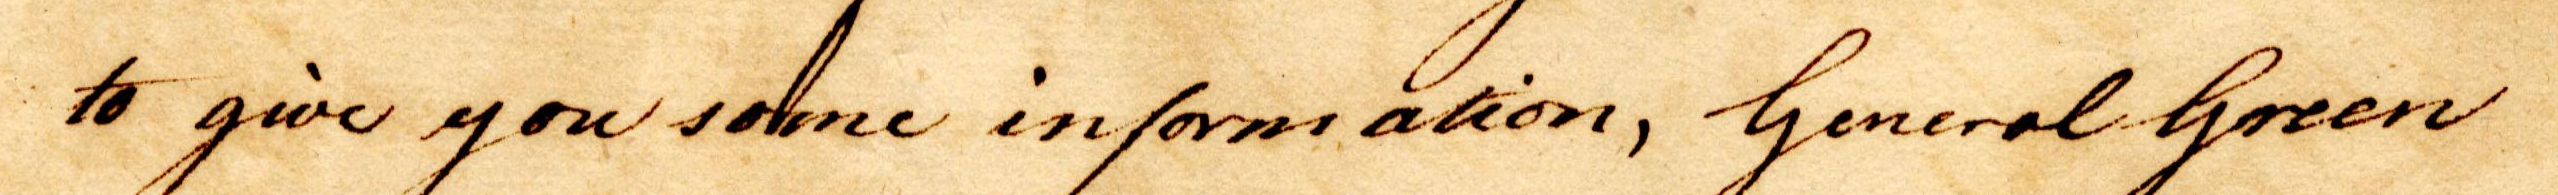to give you some information, General Green
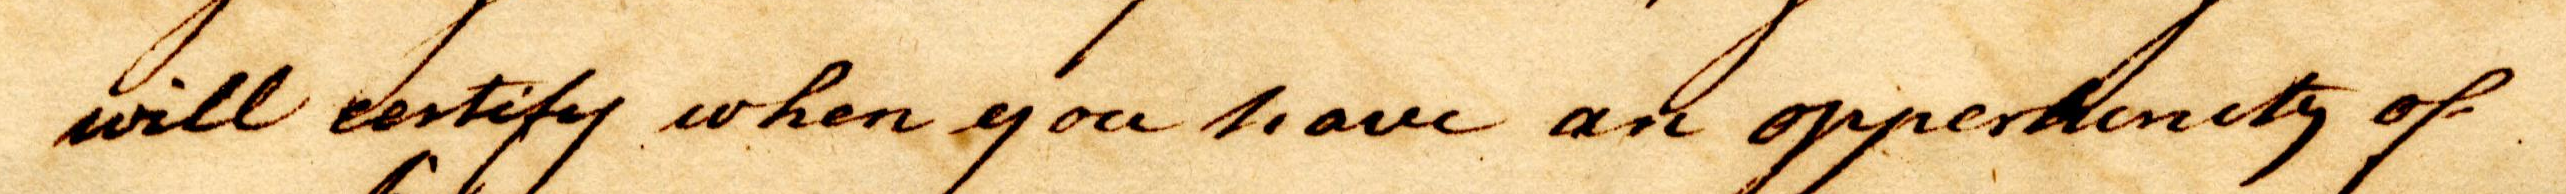will certify when you have an oppertunity of
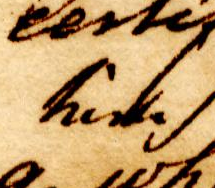him
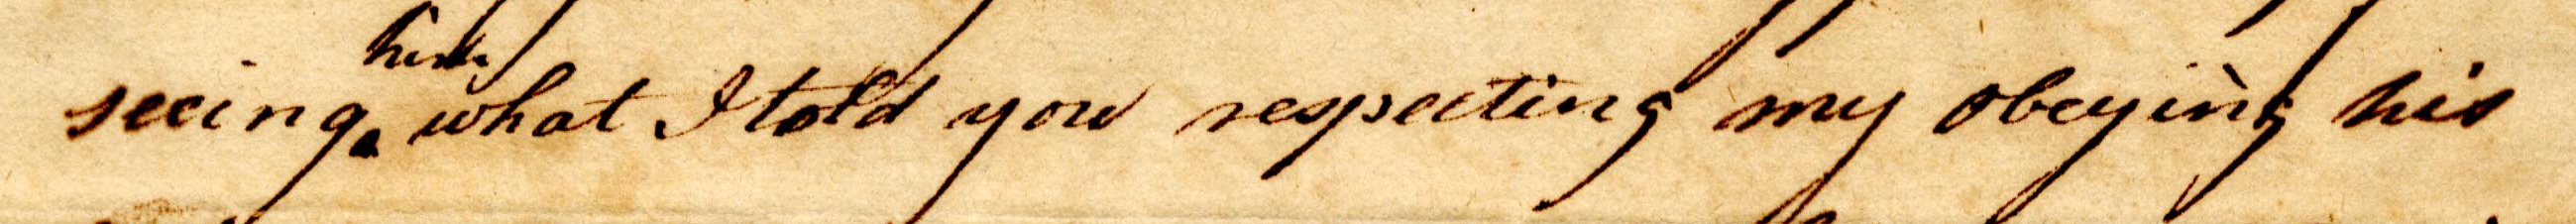seeing ^ what I told you respecting my obeying his
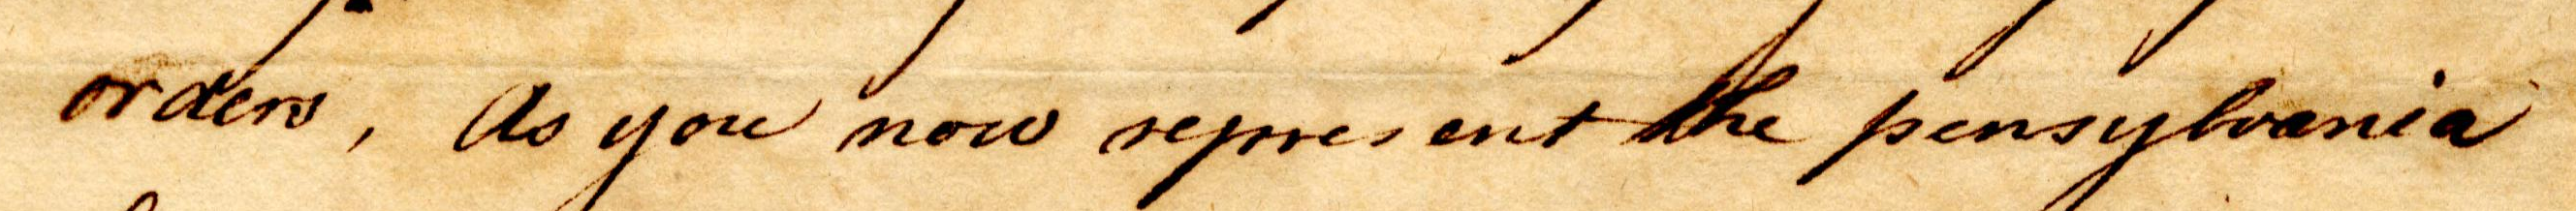orders, As you now represent the pennsylvania
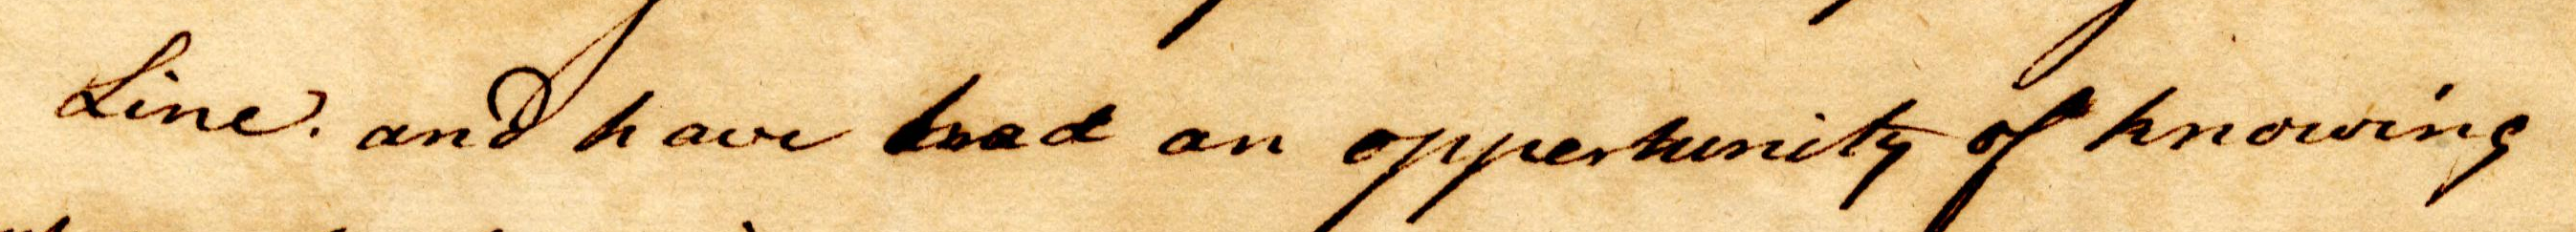Line. and have had an oppertunity of knowing
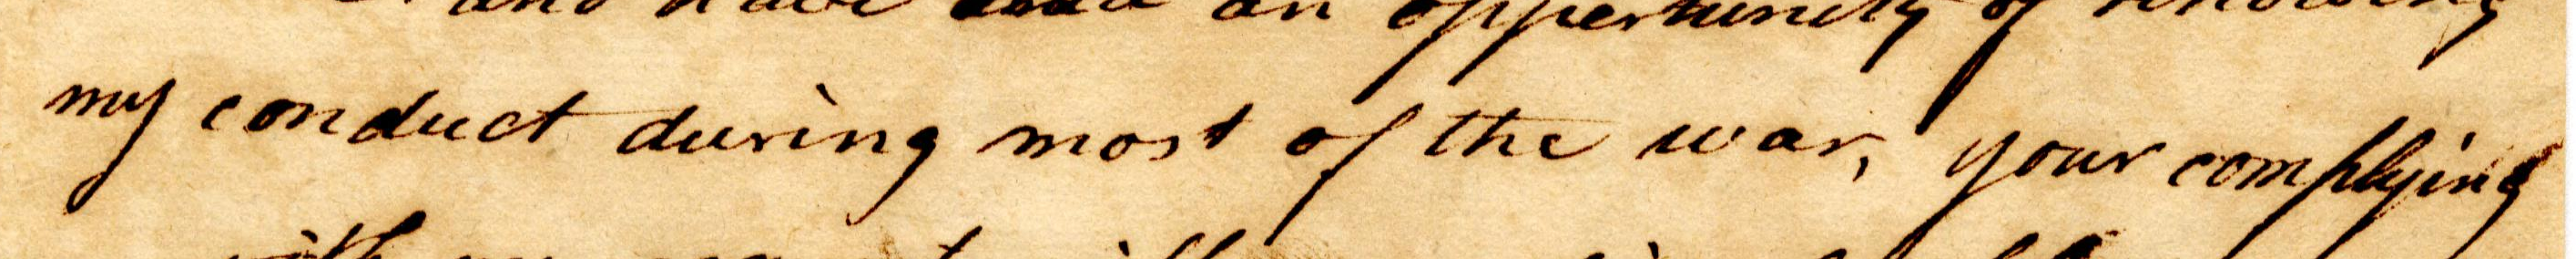my conduct during most of the war, your complying
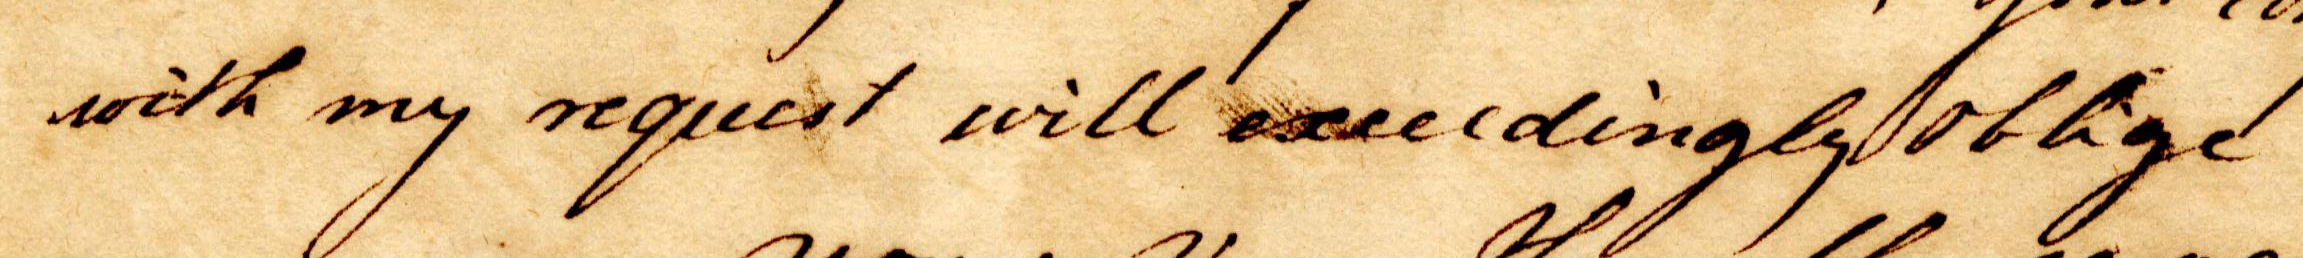with my request will exceedingly oblige
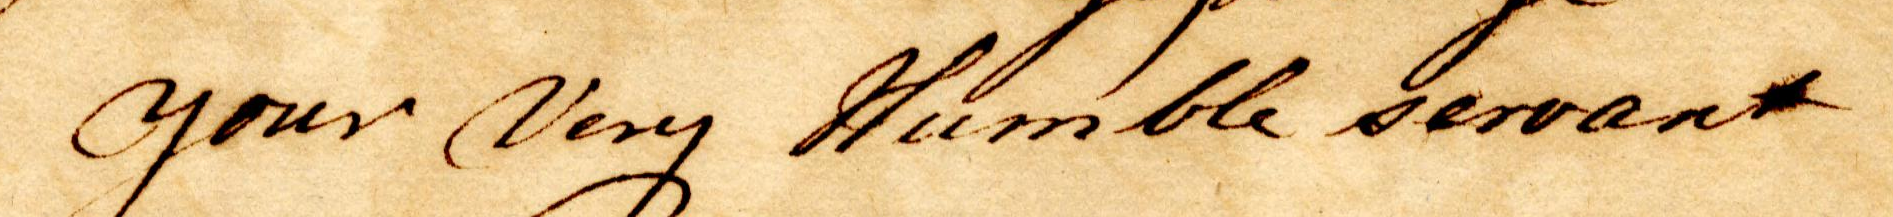your Very Humble servant
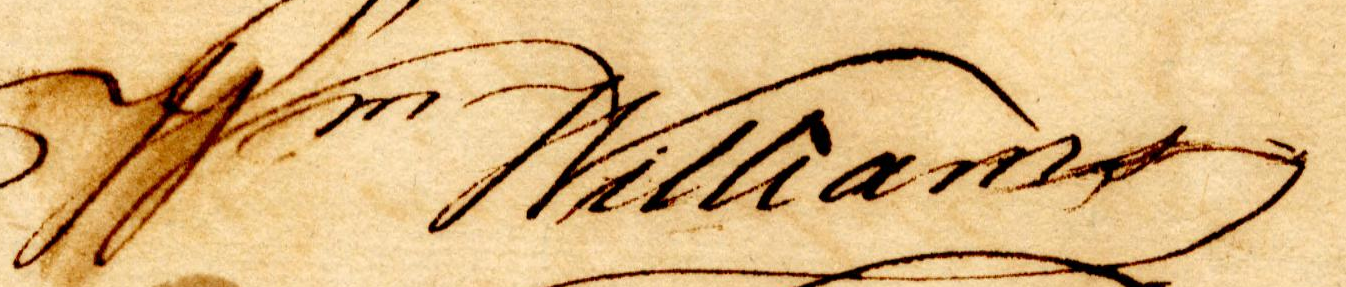W^m Williams
